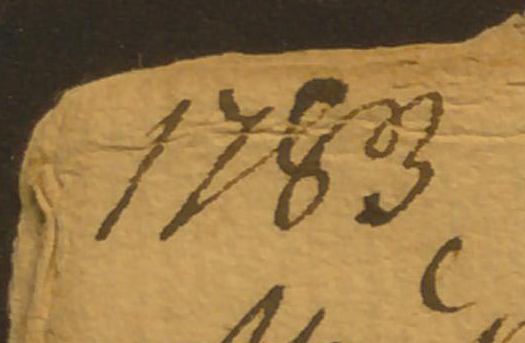1783
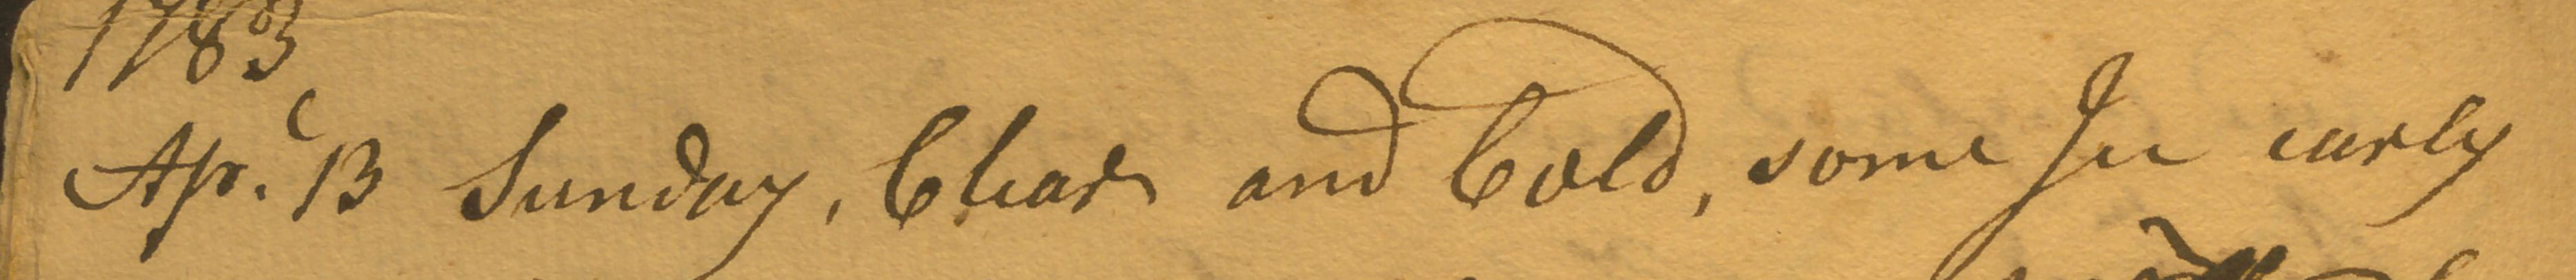Apr^l. 13 Sunday, Clear and Cold, some Ice early
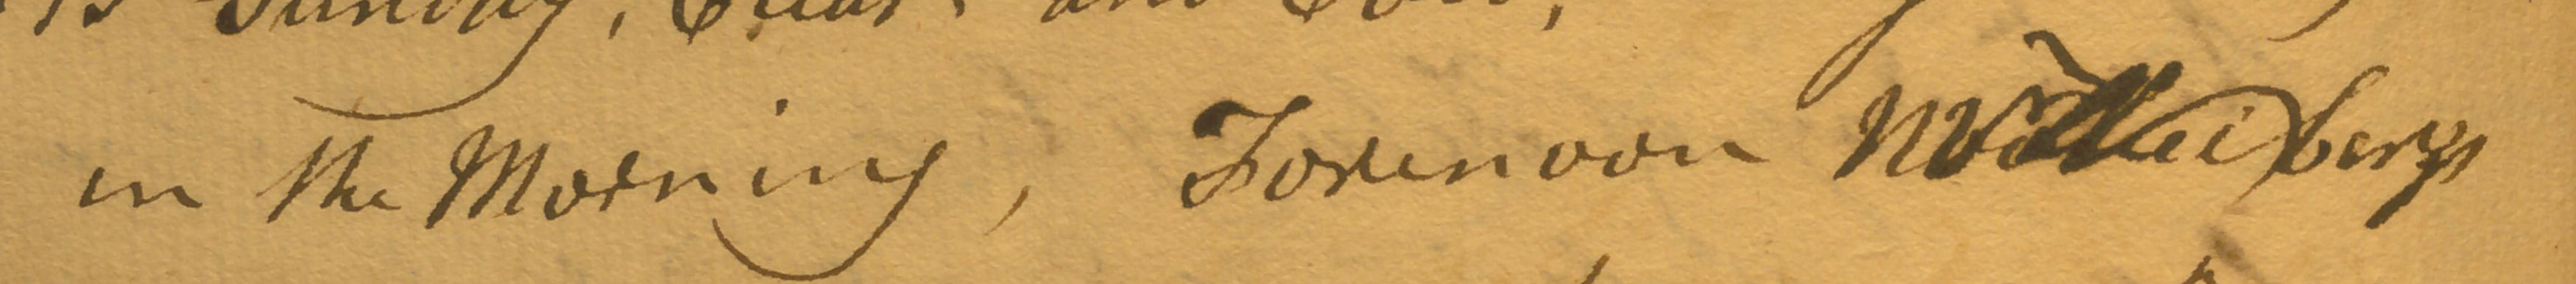in the Morning, Forenoon M^r Weibergs
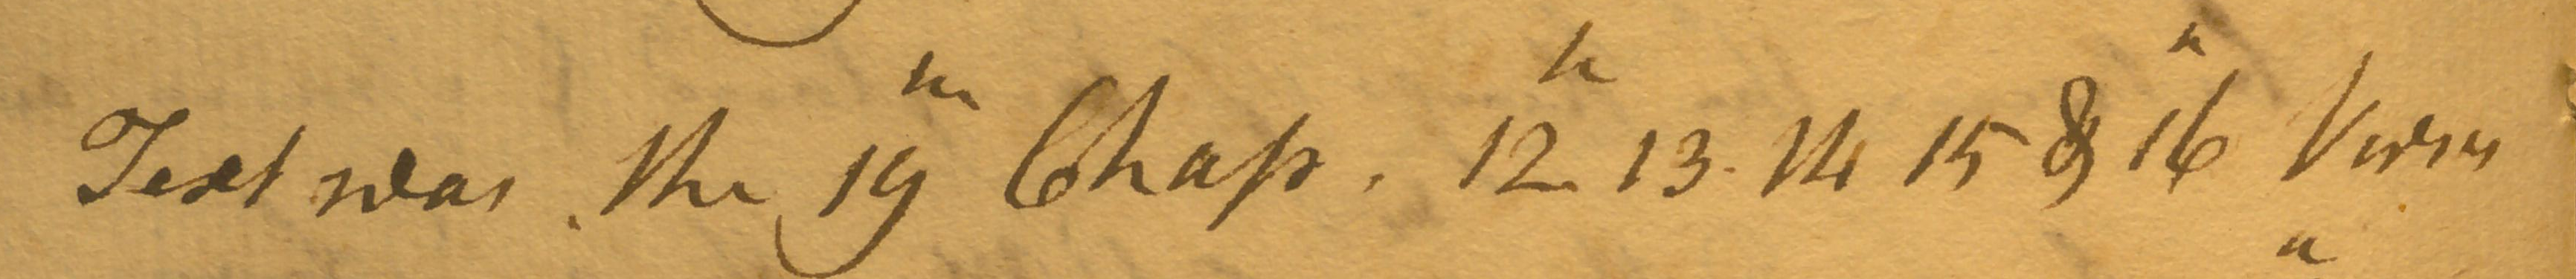Text was the 19^th Chap. 12^h. 13. 14 15 & 16^h Verses
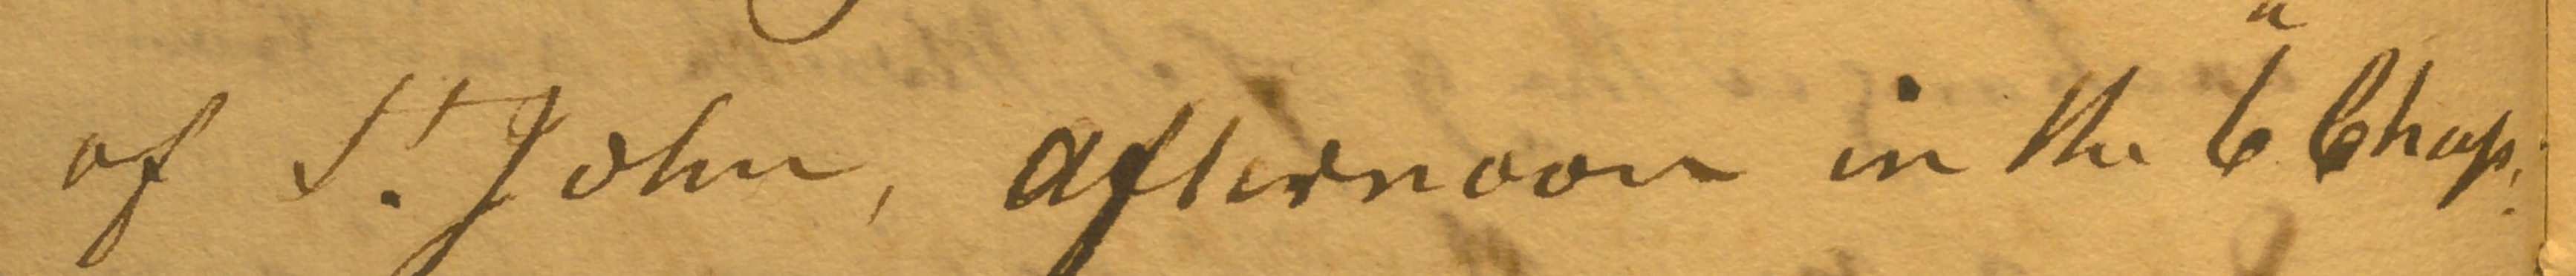of S^t. John, afternoon in the 6^th Chaps
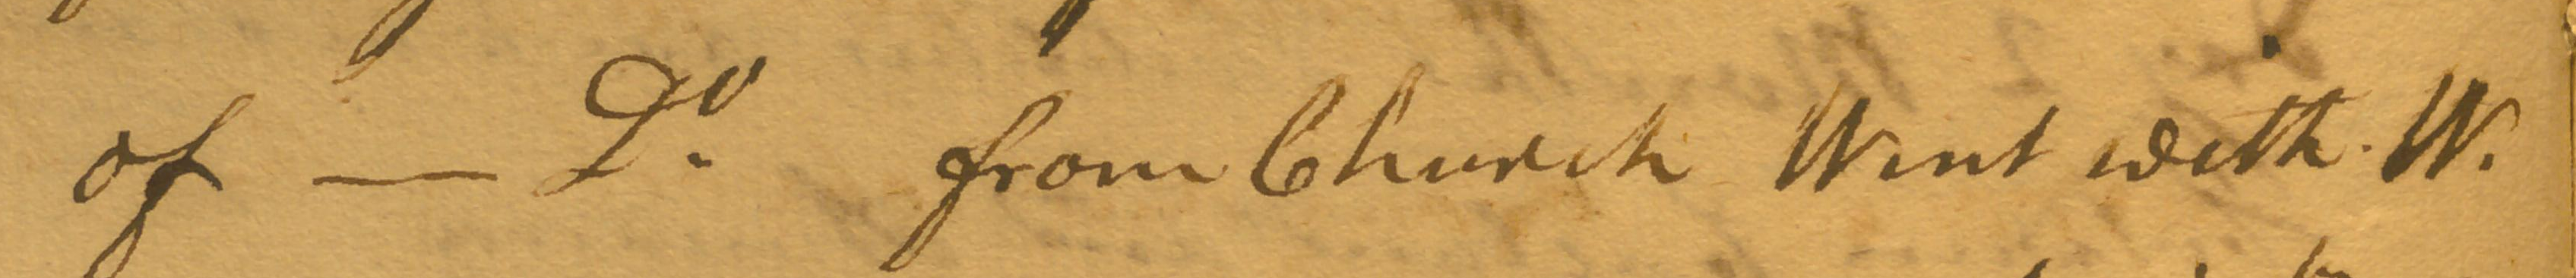of- D^o. from Church Went with W.
